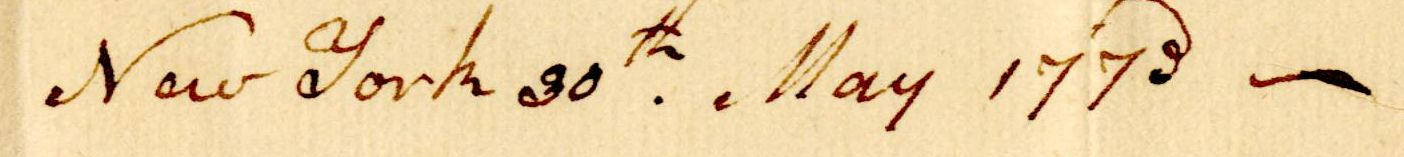New York 30^th. May 1778-
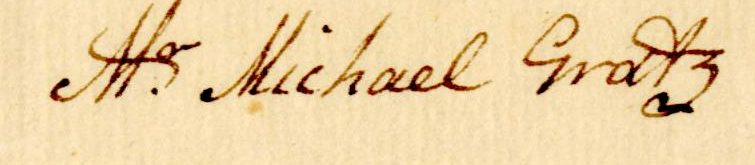M^r. Michael Gratz
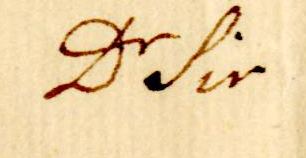Dr Sir
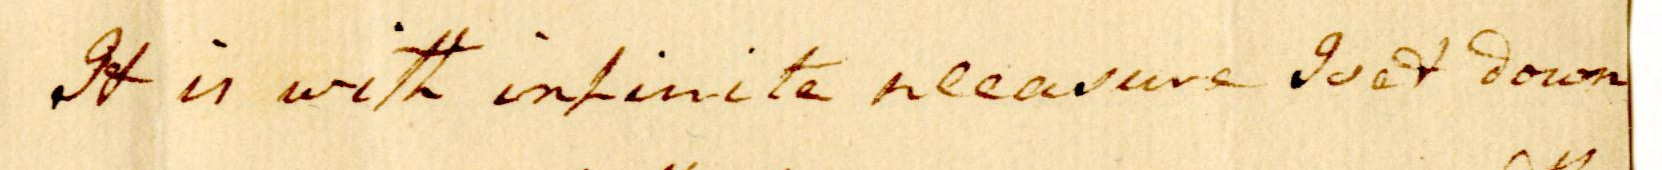It is with infinite pleasure I set down
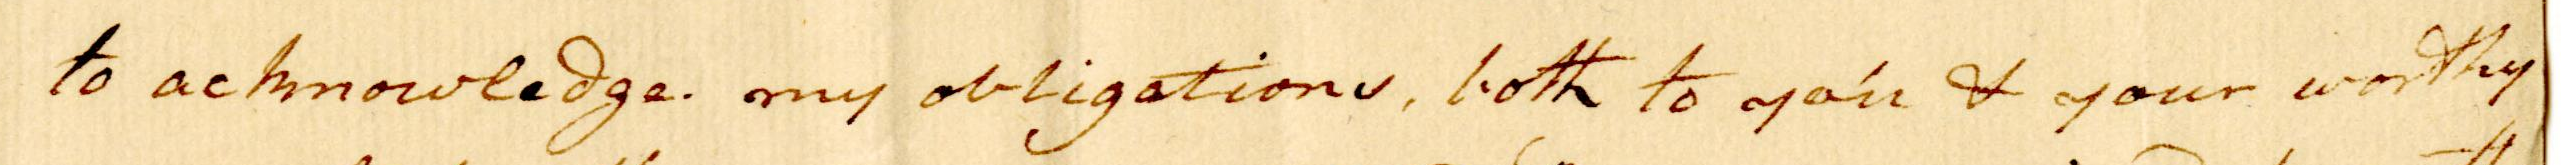to acknowledge my obligations, both to you & your worthy
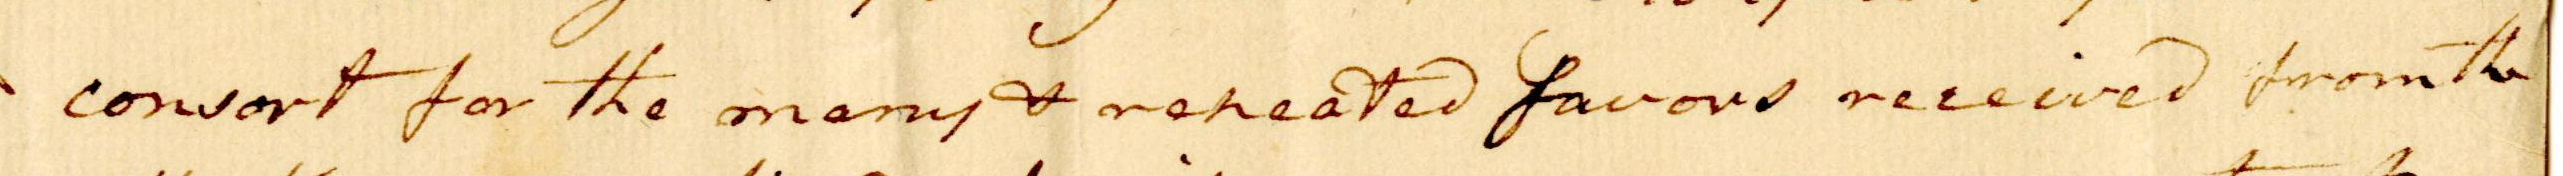consort for the many & repeated favours received from the
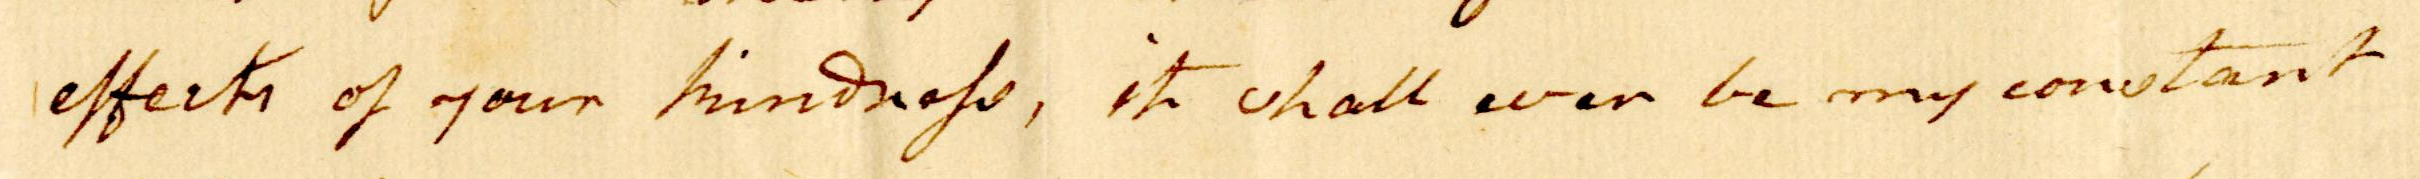effects of your kindness, it shall ever be my constant
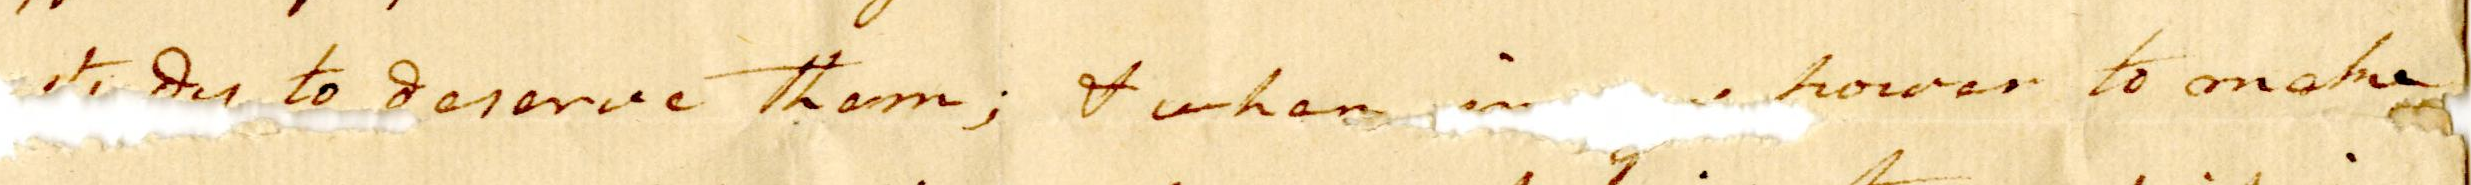[____] to deserve them; [_____] power to make
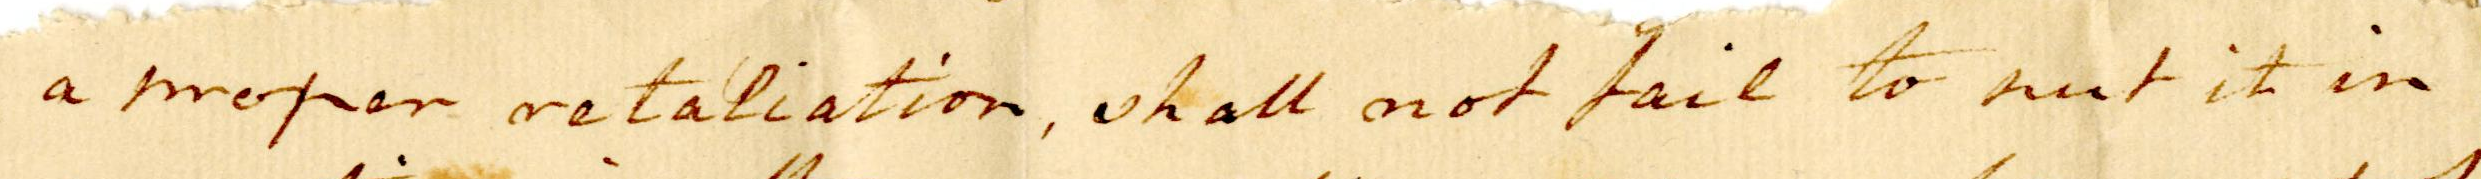a proper retaliation, shall not fail to met it in
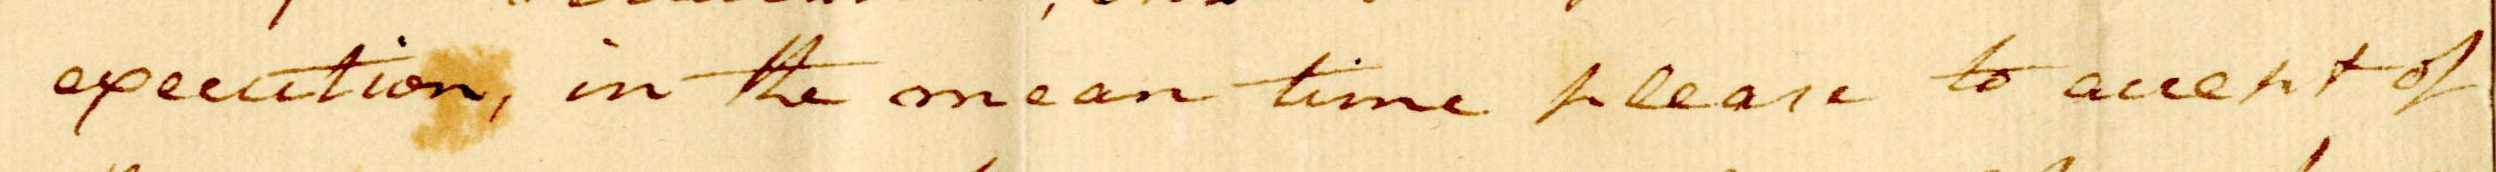execution, in the mean time please to accept of
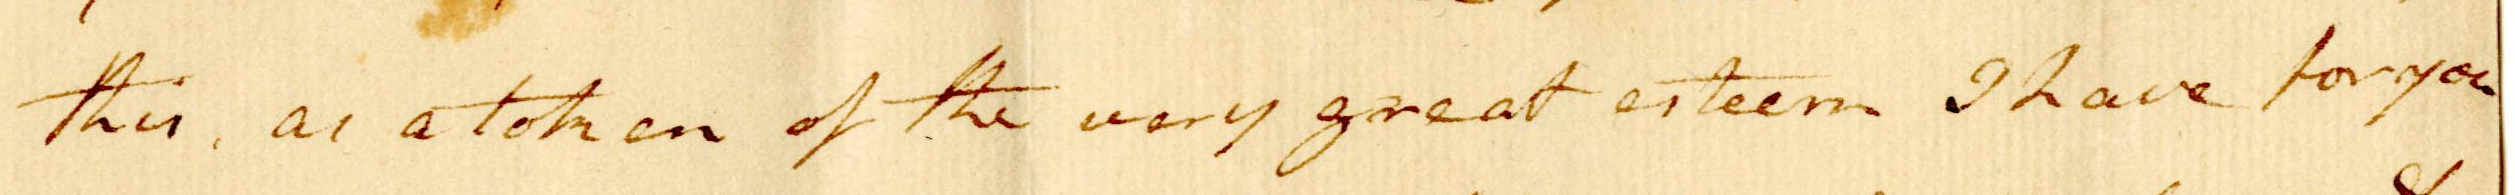this as a token of the very great esteem I have for you
